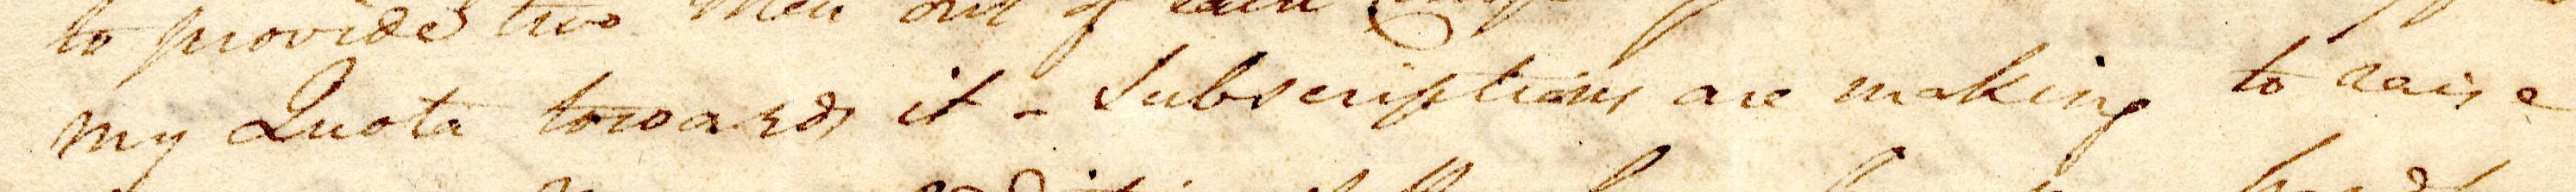my Quota towards it. Subscriptions are making to raise
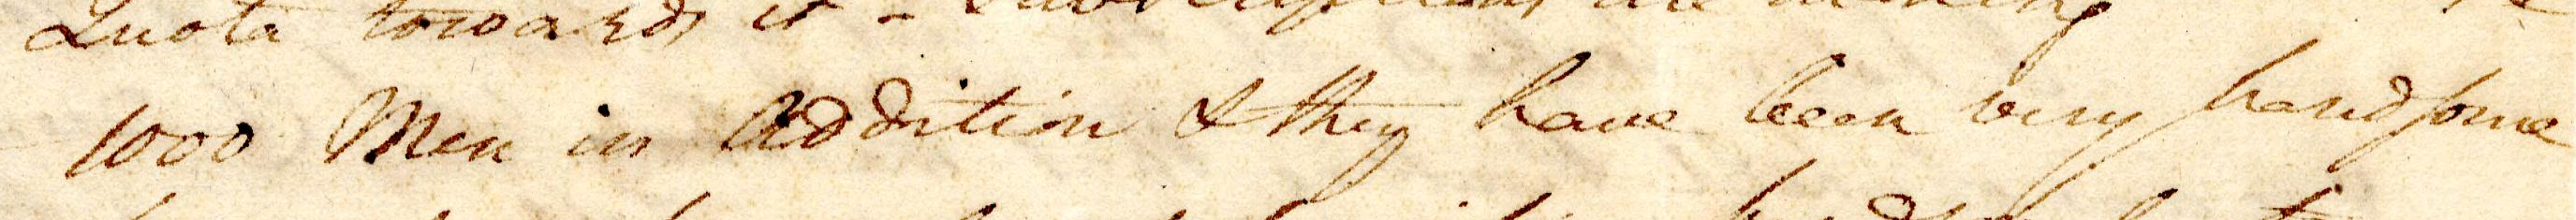1000 Men in Addition & they have been very handsome
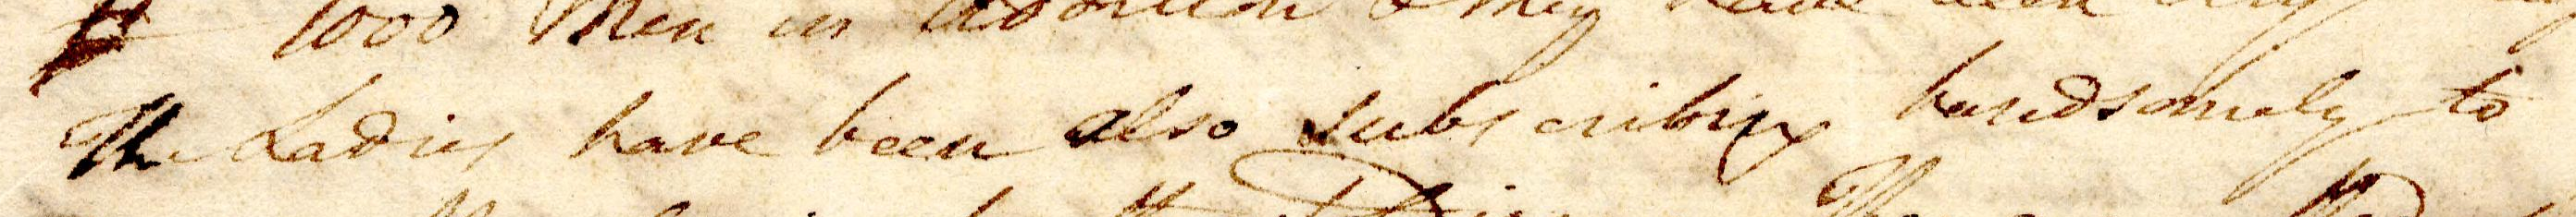The Ladies have been also subscribing handsomely to
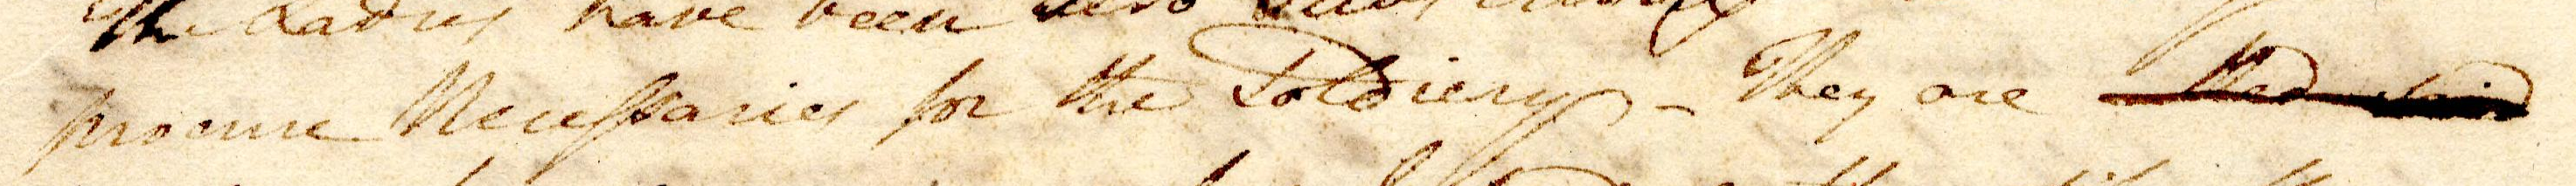procure Necessaries for the Soldiery. They are [_____]
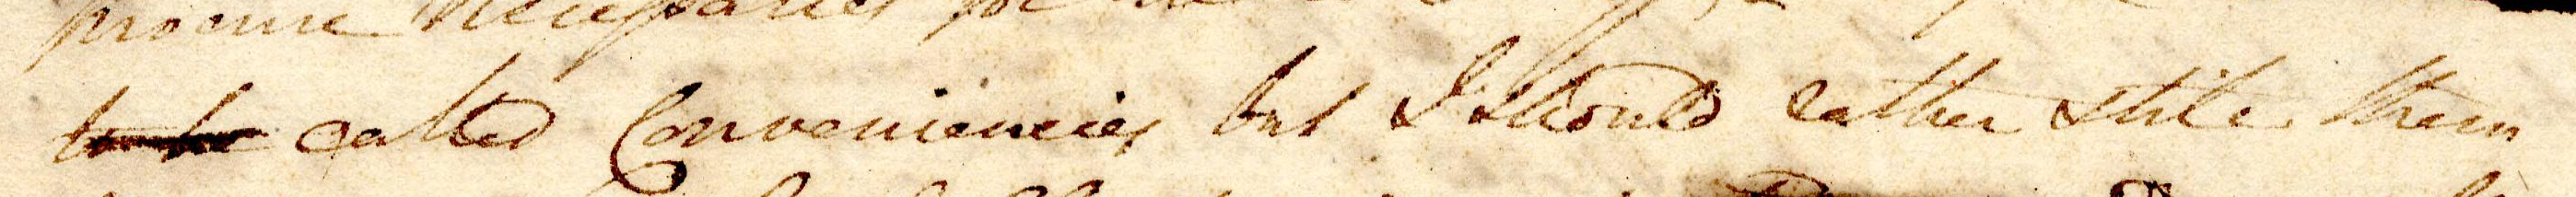take called Conveniences but I Should rather Stile them
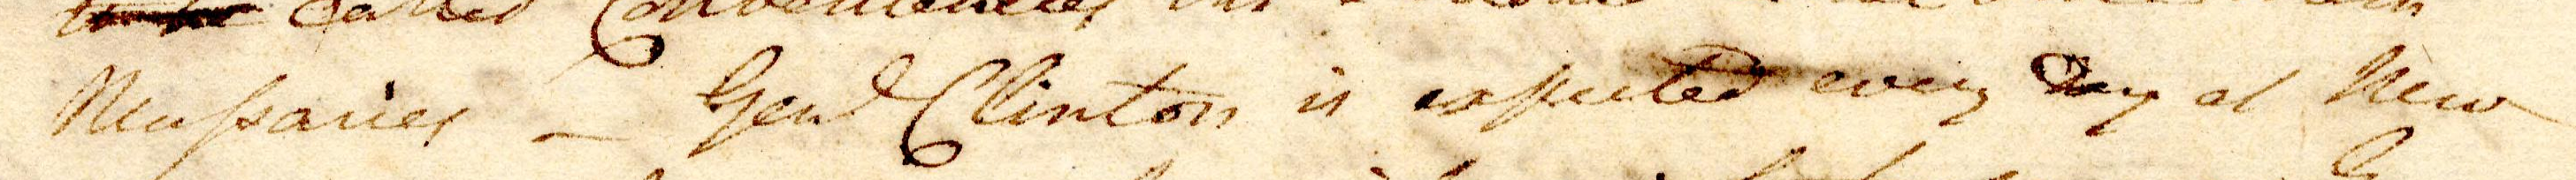Mussaries. Gen^l Clinton is expected every Day at New
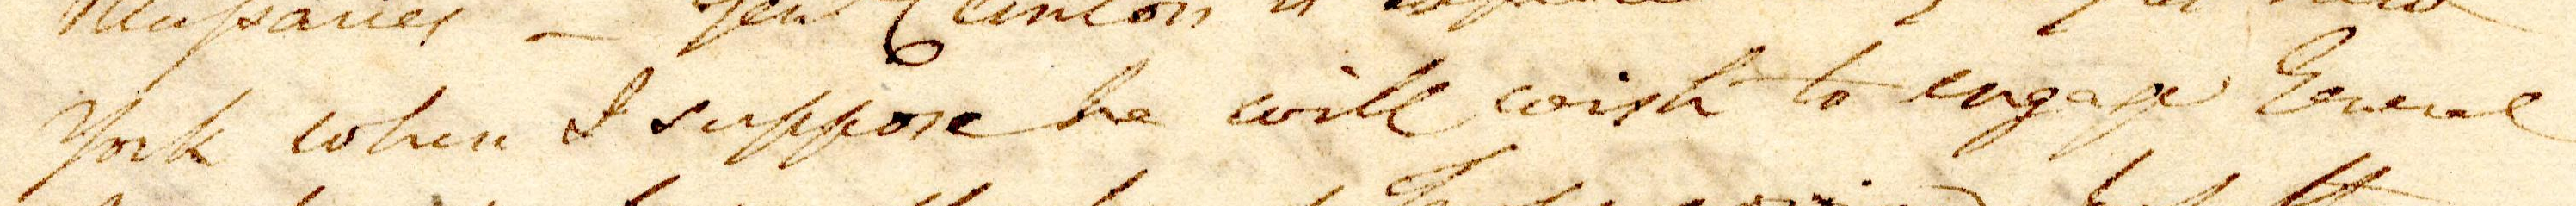York when I suppose he will wish to engage General
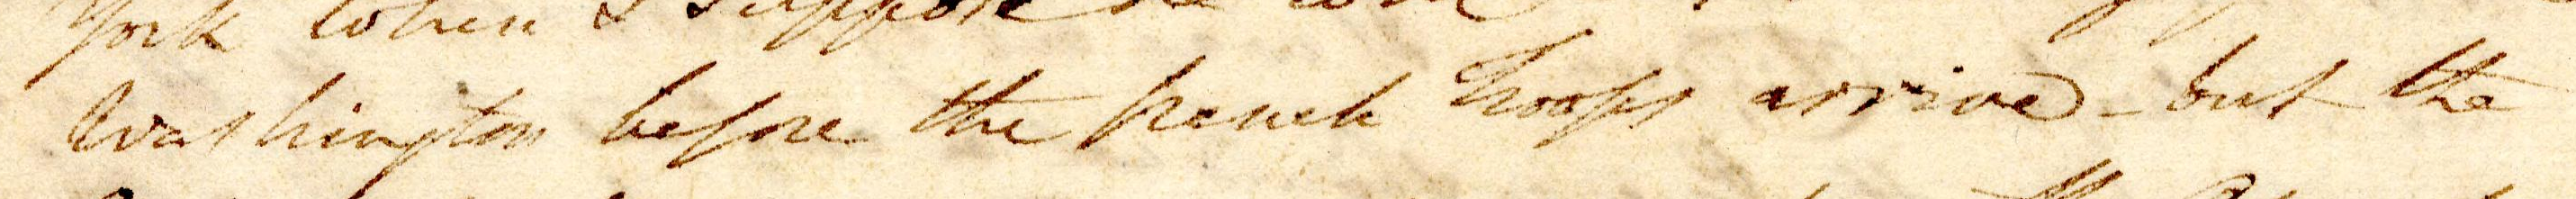Washington before the French Troops arrive- but the
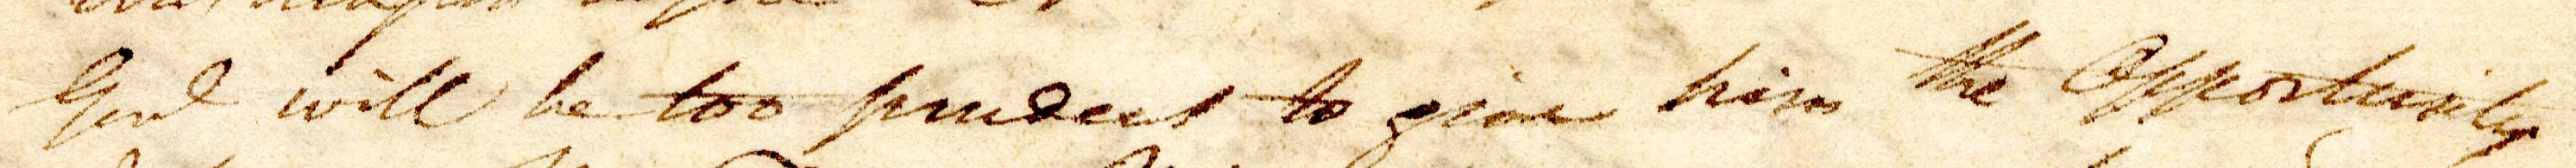Gen^l. will be too prudent to give him tho Opportunity
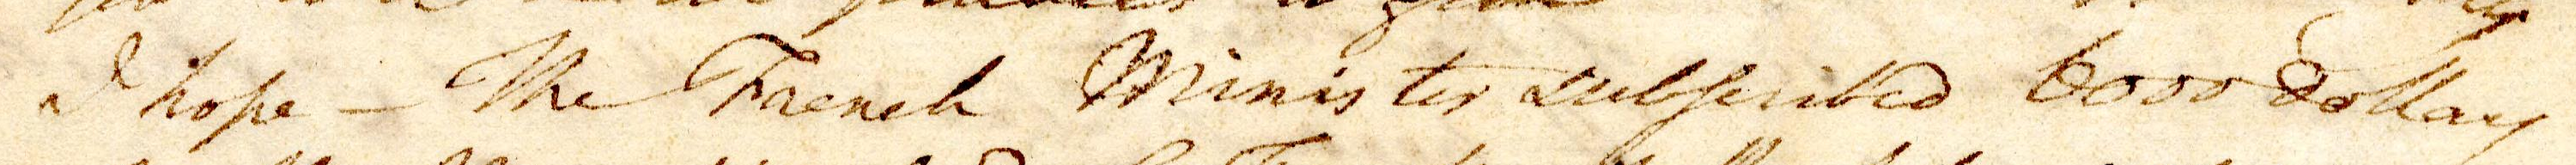I hope- The French Minister subscribed 6000 dollars
